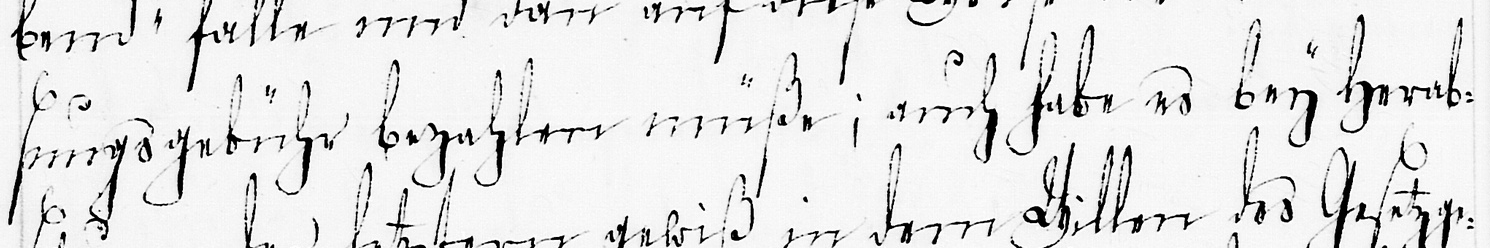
ungsgebühr bezahlen müße; auch habe es bey Herab¬
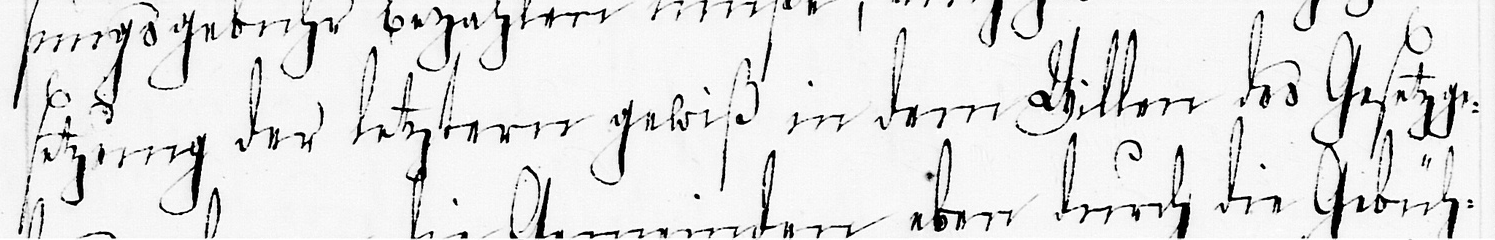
setzung der letztern gewiß in dem Willen des Gesetzg¬
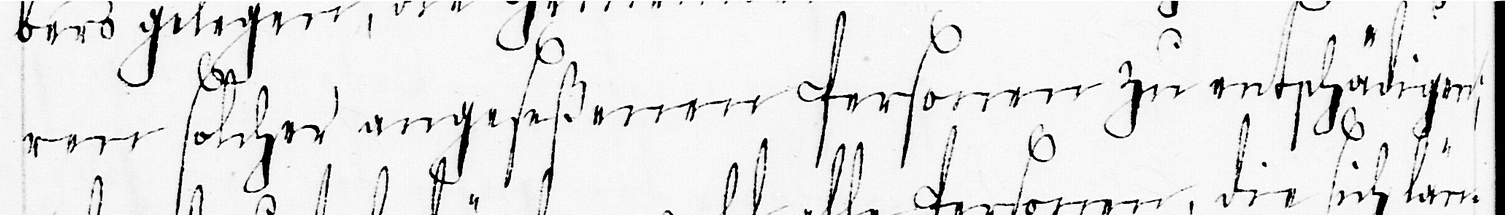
ren solcher angeseßenen Personen zu entschädigen;
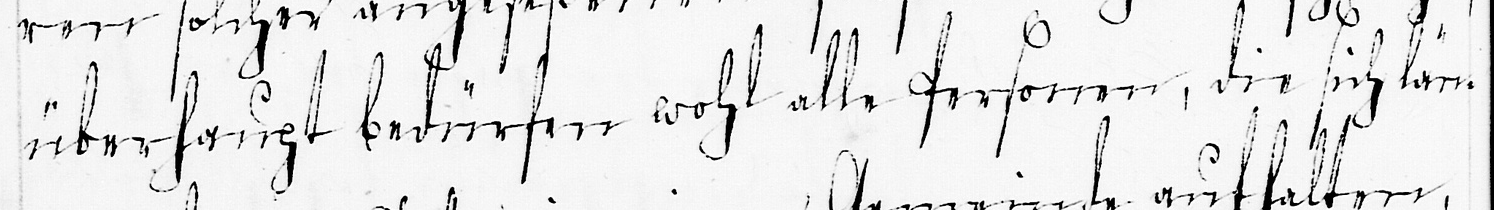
überhaupt bedürfen wohl alle Personen, die sich län¬
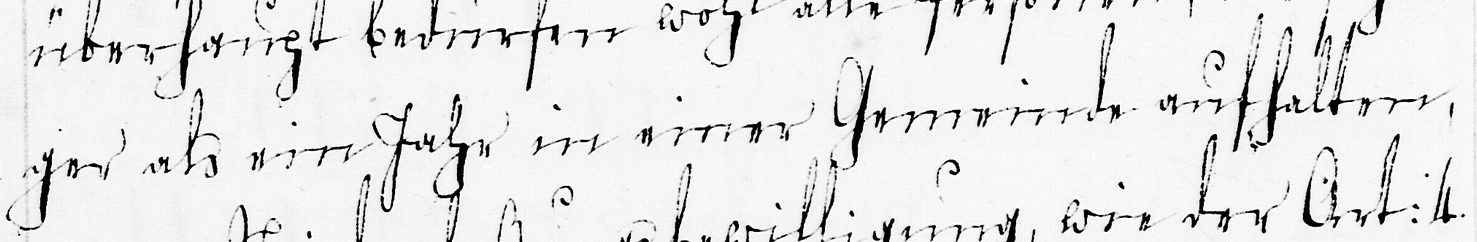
ger als ein Jahr in einer Gemeinde aufhalten,
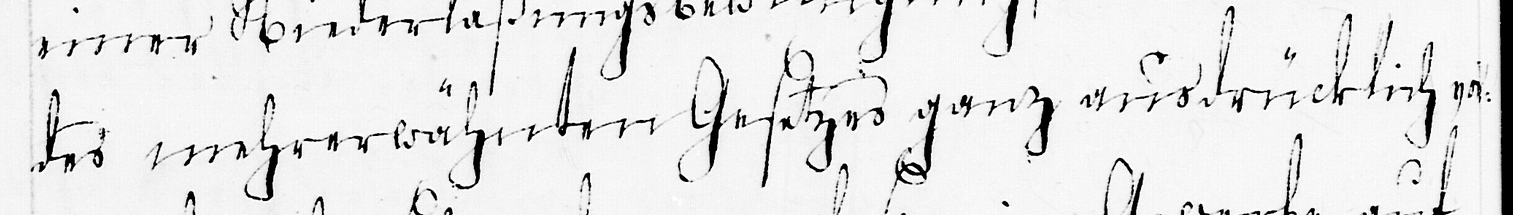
des mehrerwähnten Gesetzes ganz ausdrücklich vo¬
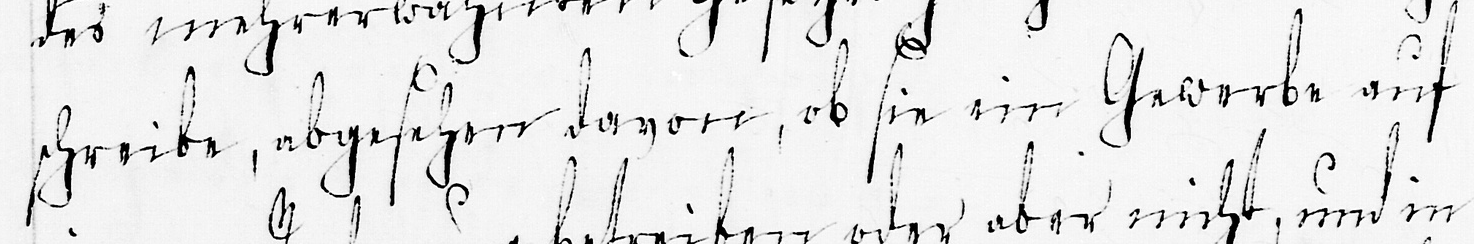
schreibe, abgesehen davon, ob sie ein Gewerbe auf
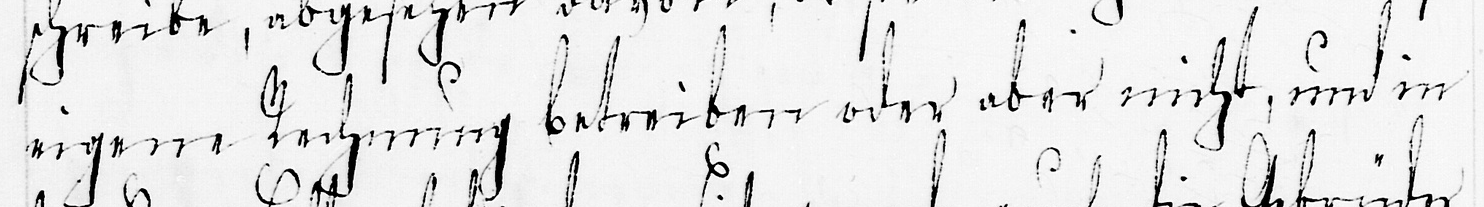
eigene Rechnung betreiben oder aber nicht, und in
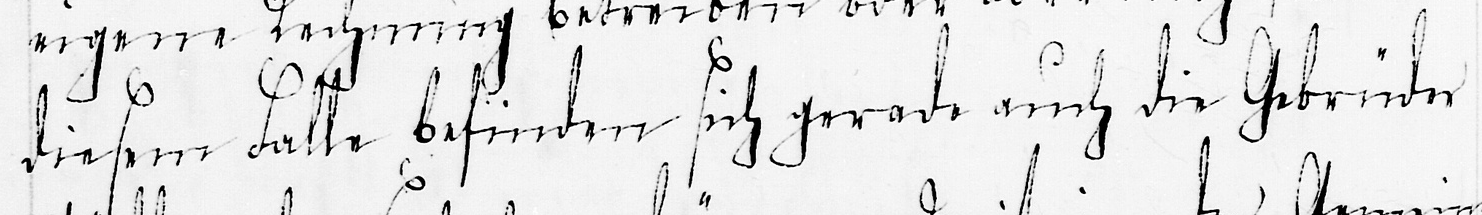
diesem Falle befinden sich gerade auch die Gebrüder
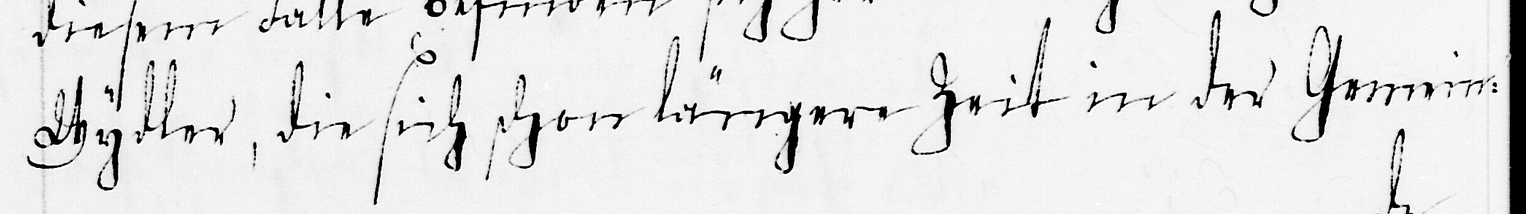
Wydler, die sich schon längere Zeit in der Gemein-
